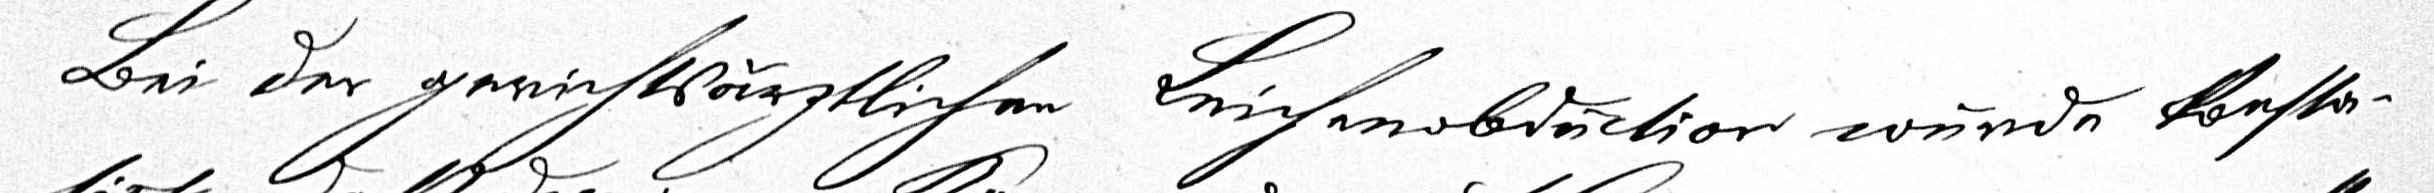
Bei der gerichtsärztliche Leichenobduction wurde konsta¬
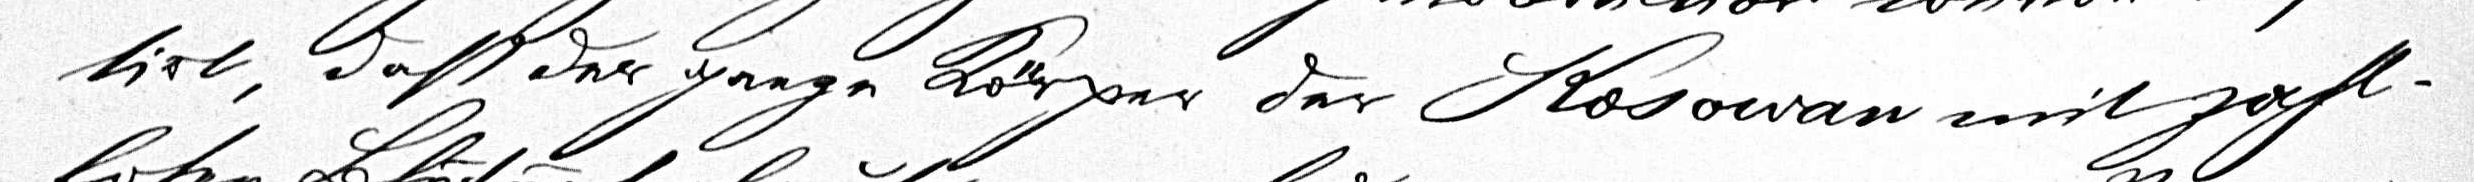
tirt, daß der ganze Körper der Kosowan mit zahl¬
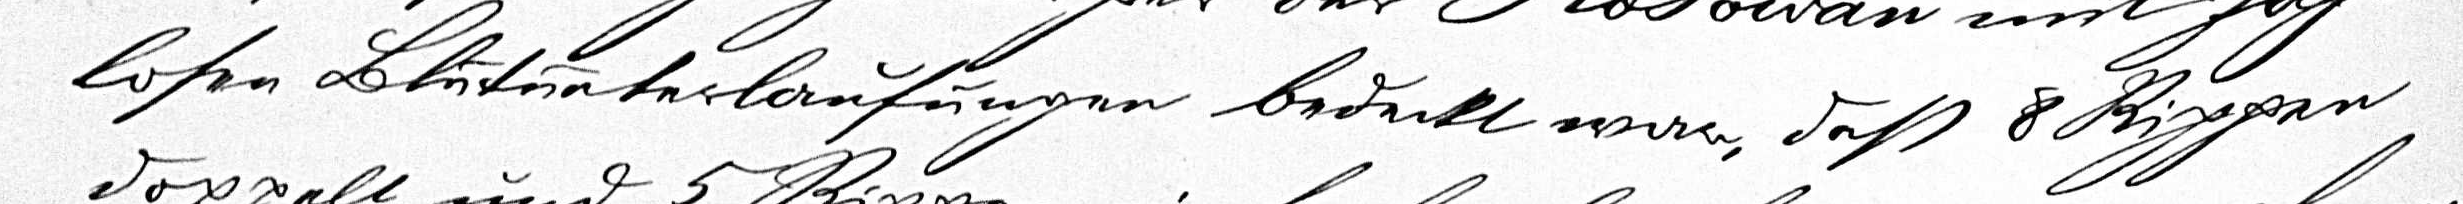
losen Blutunterlaufungen bedeckt war, daß 8 Rippen
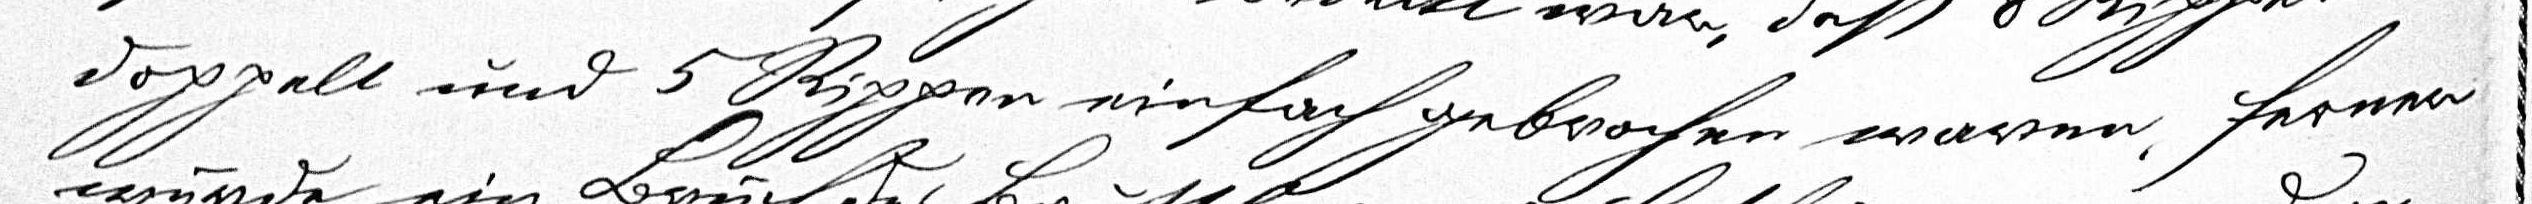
doppelt und 5 Rippen einfach gebrochen waren, ferner
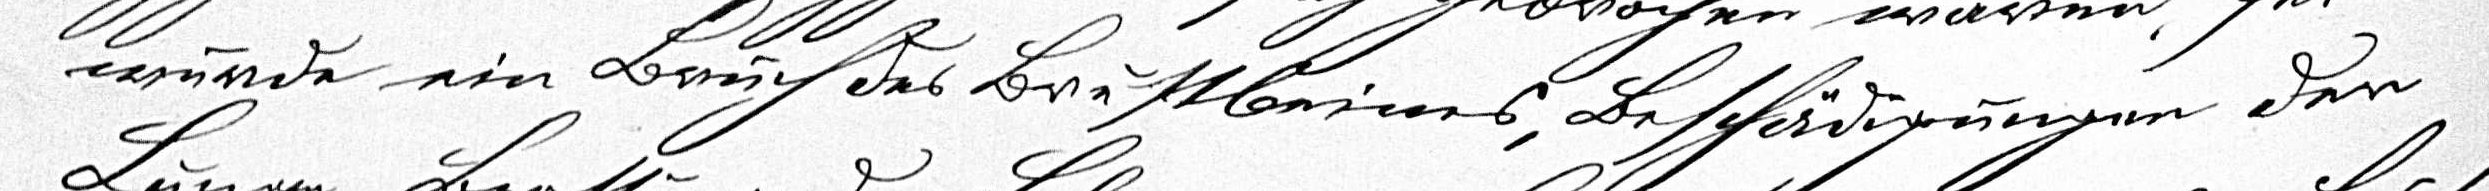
wurde ein Bruch des Brustbeines, Beschädigungen den
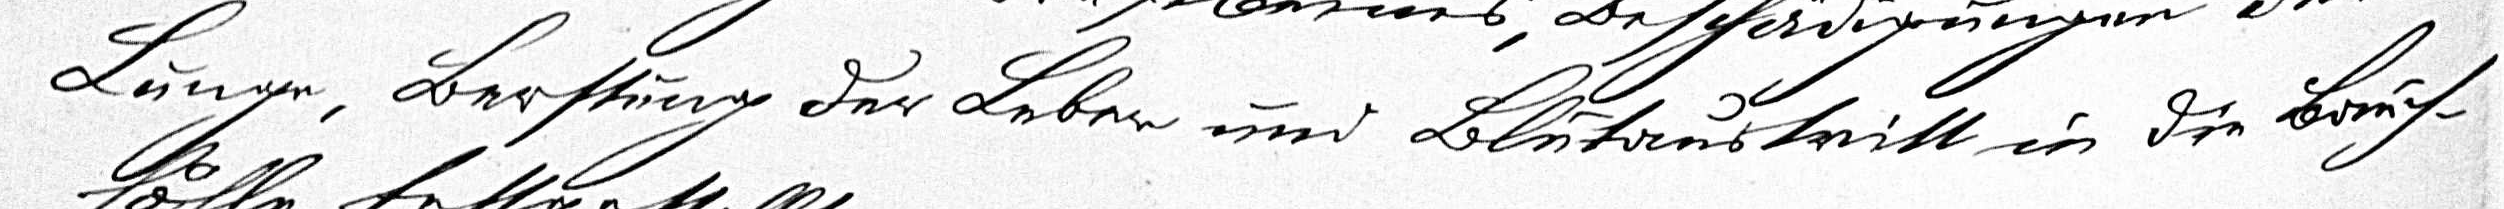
Lungen, Berstung der Leber und Blutaustritt in die Bauch¬
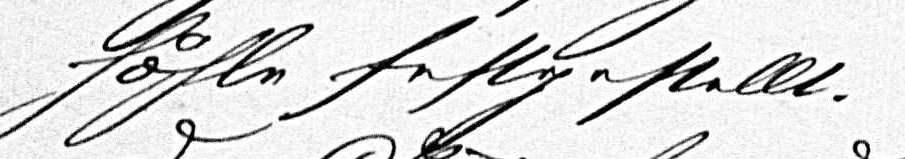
höhle festgestellt.
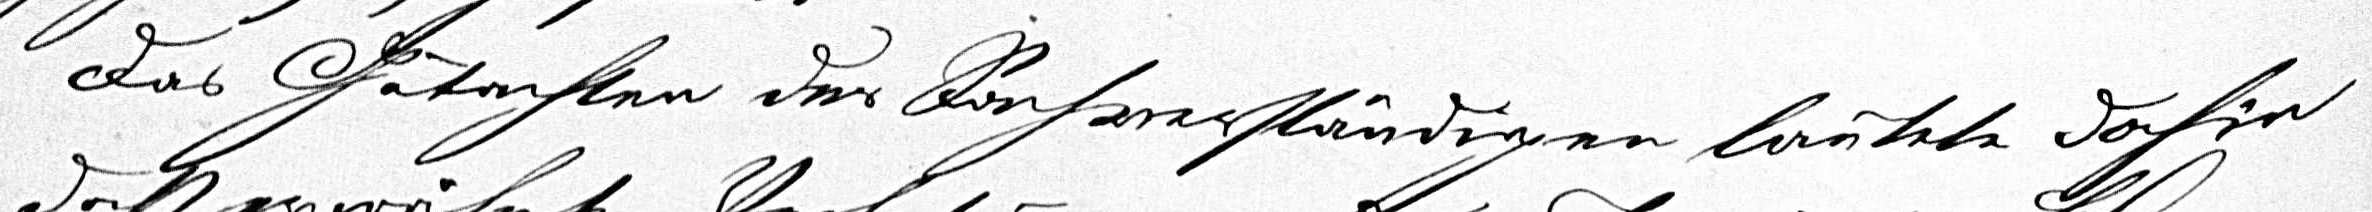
Das Gutachten der Sachverständigen lautete dahin
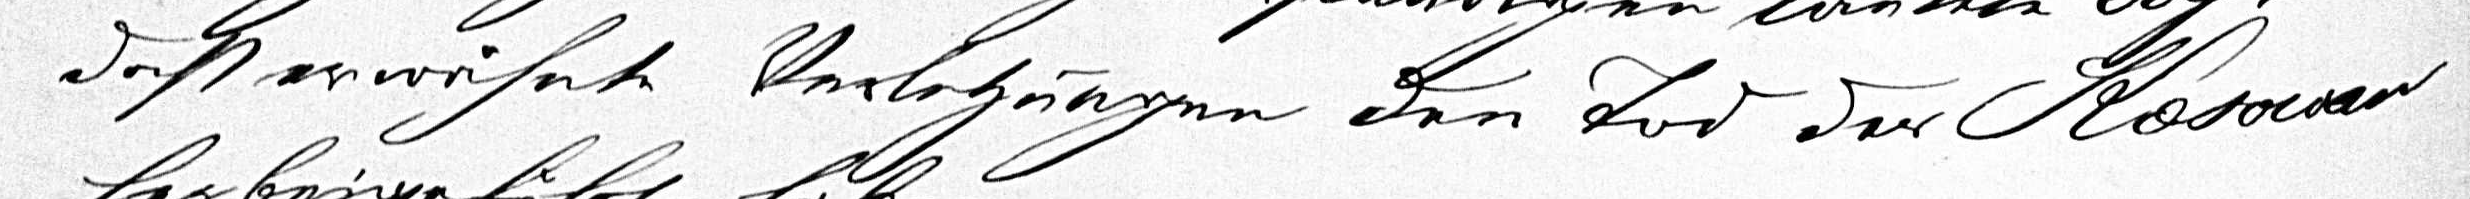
daß erwähnte Verletzungen den Tod der Kosowan
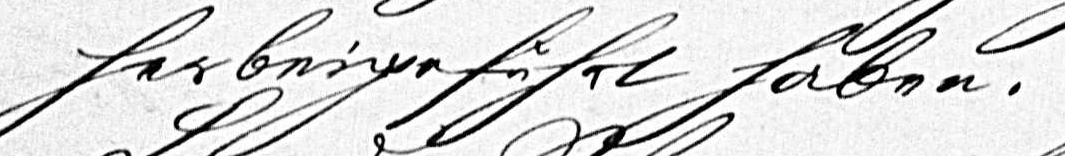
herbeigeführt haben.
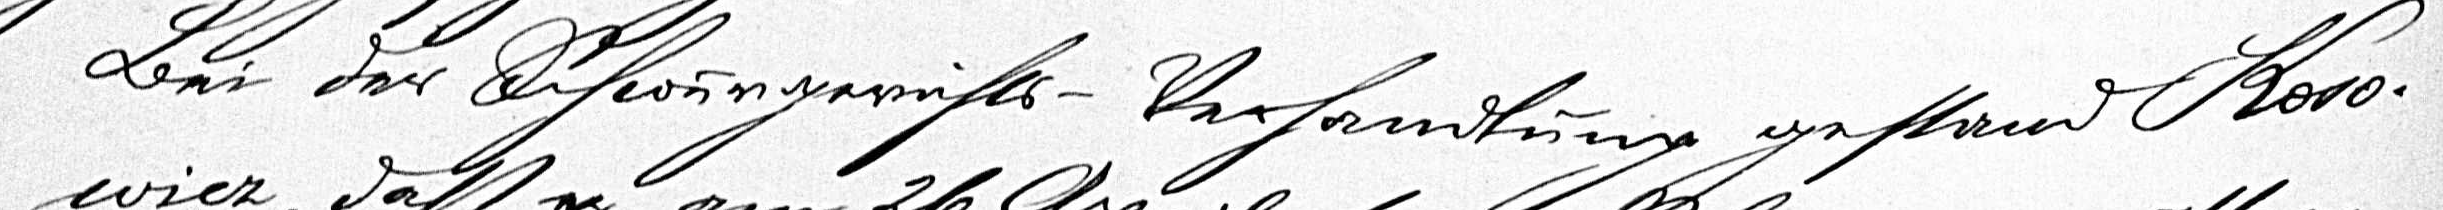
Bei der Schwurgerichts- Verhandlung gestand Koso¬
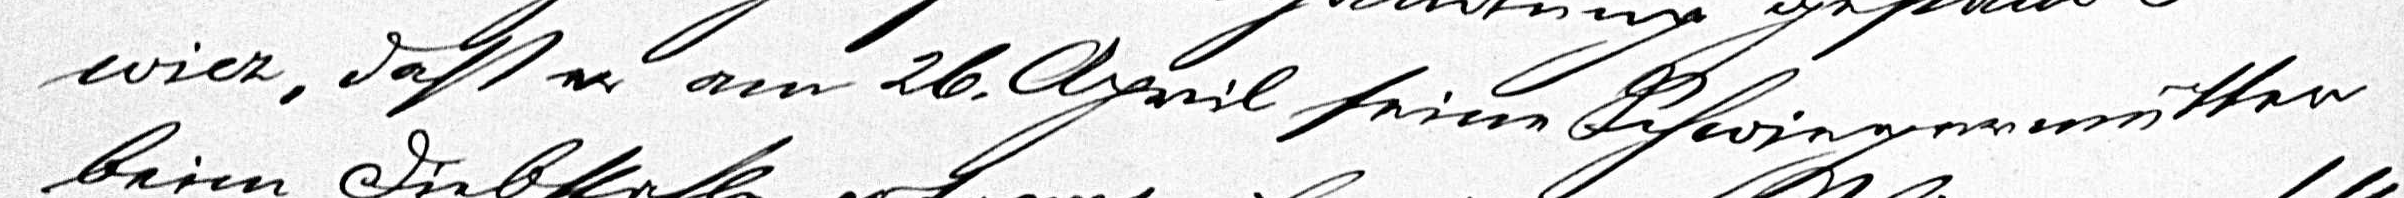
wicz, daß er am 26. April seine Schwiegermutter
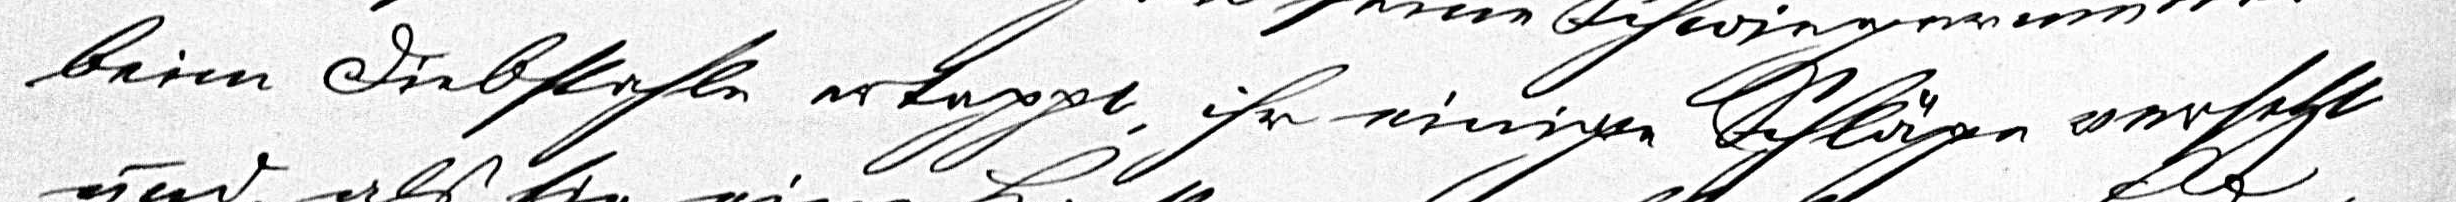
beim Diebstahle ertappt, ihr einige Schläge versetzt
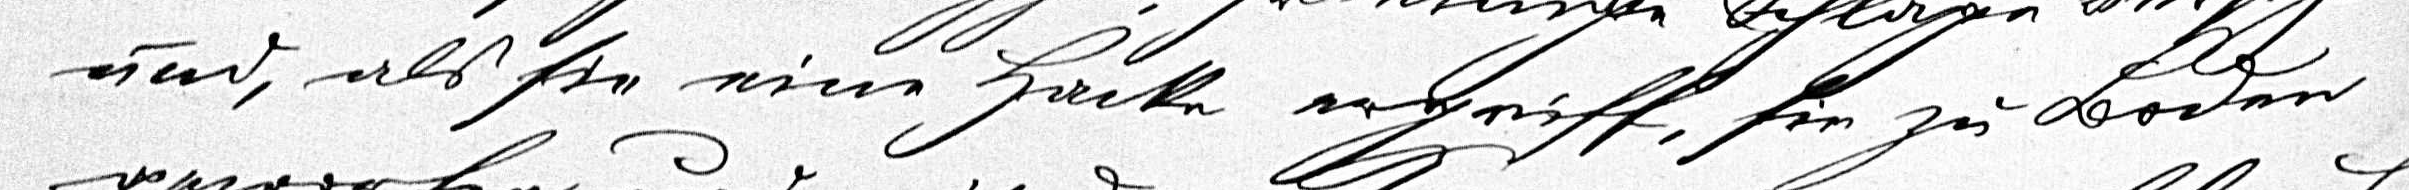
und, als sie eine Hacke ergriff, sie zu Boden
